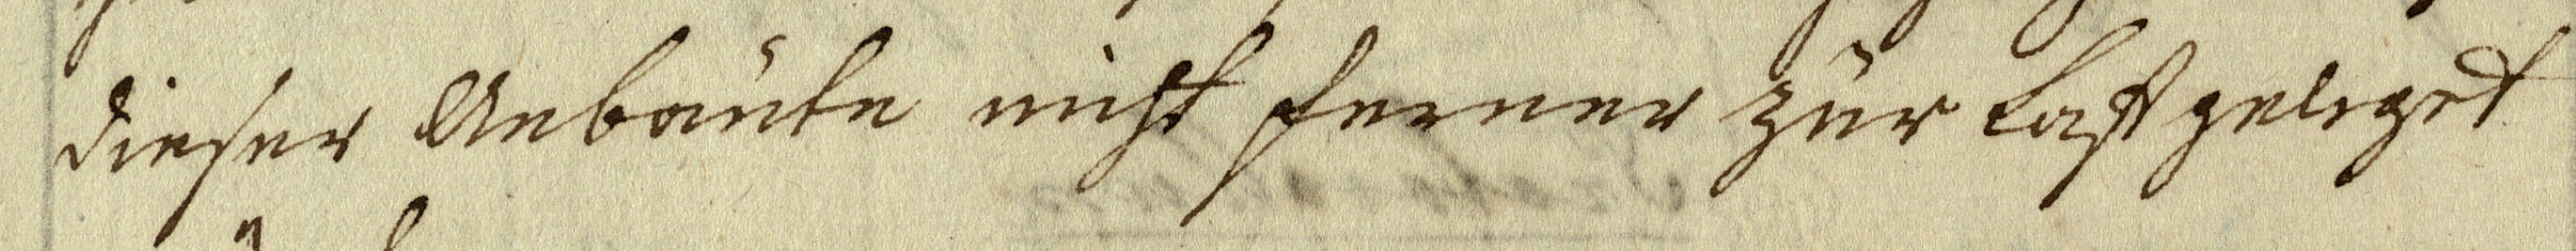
dieser Anbaute nicht ferner zur Last geleget
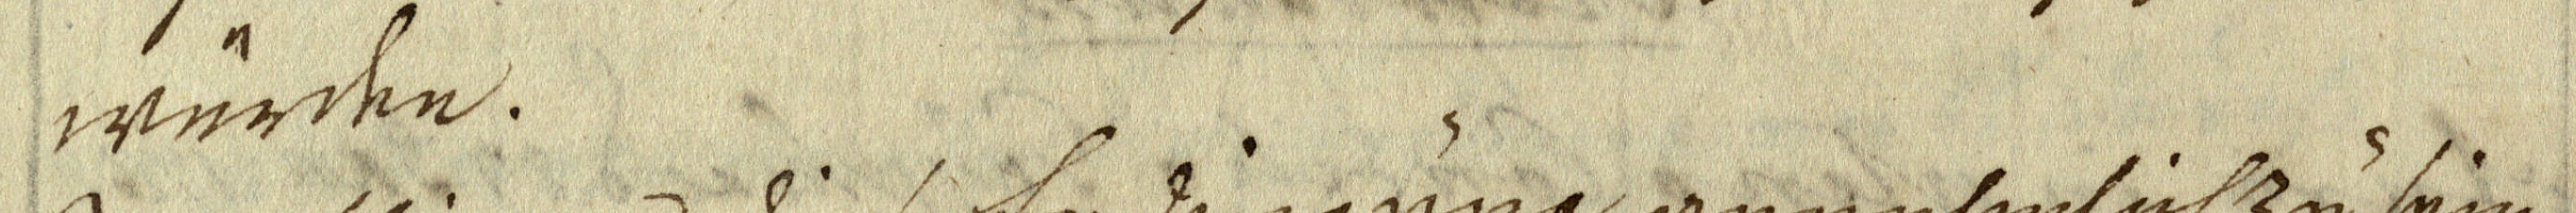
würden.
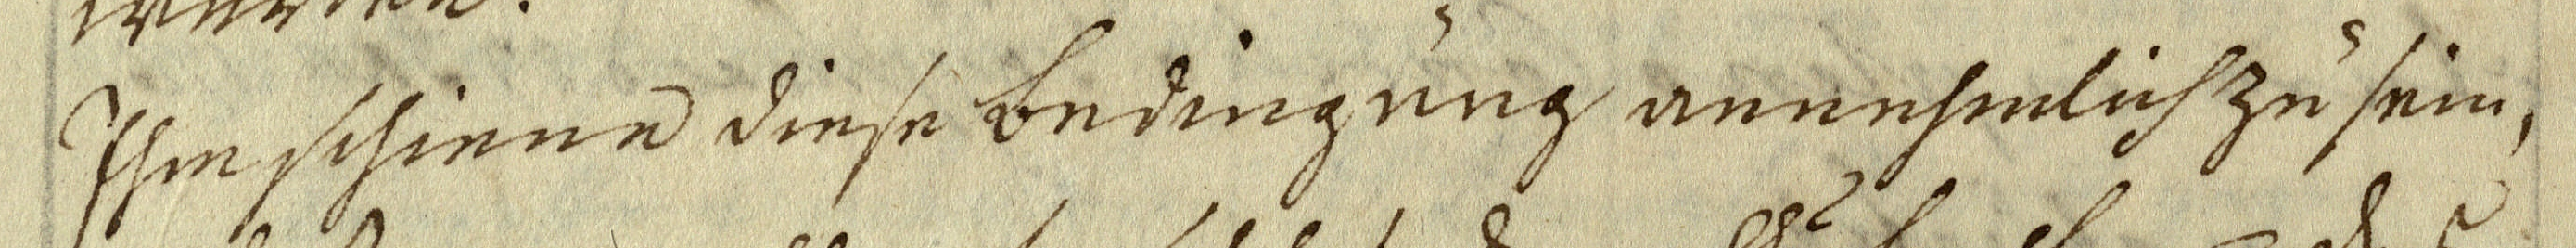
Ihm schiene diese Bedingung annehmlich zu sein,
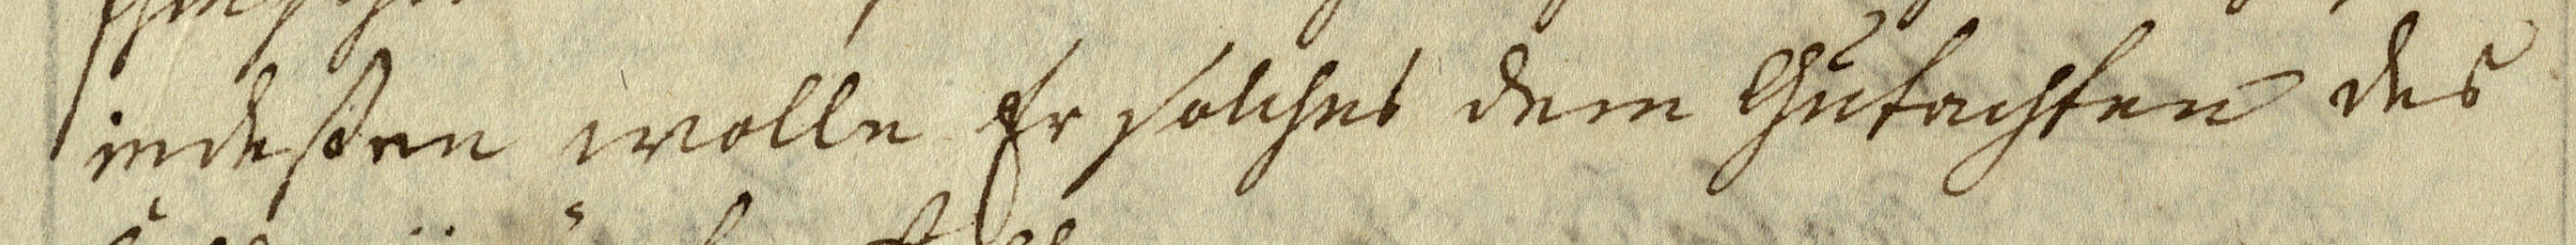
indessen wolle Er solches dem Gutachten des
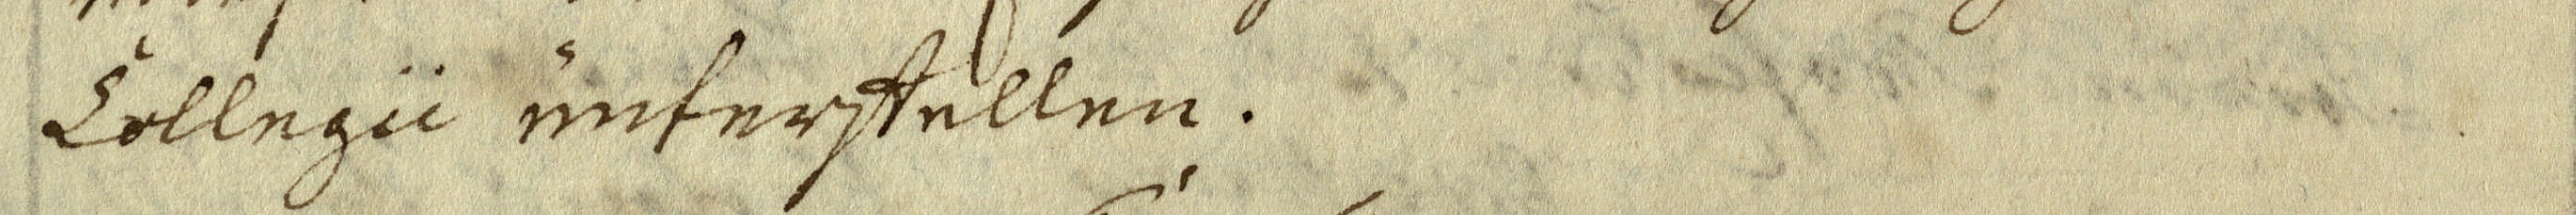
Collegii unterstellen.
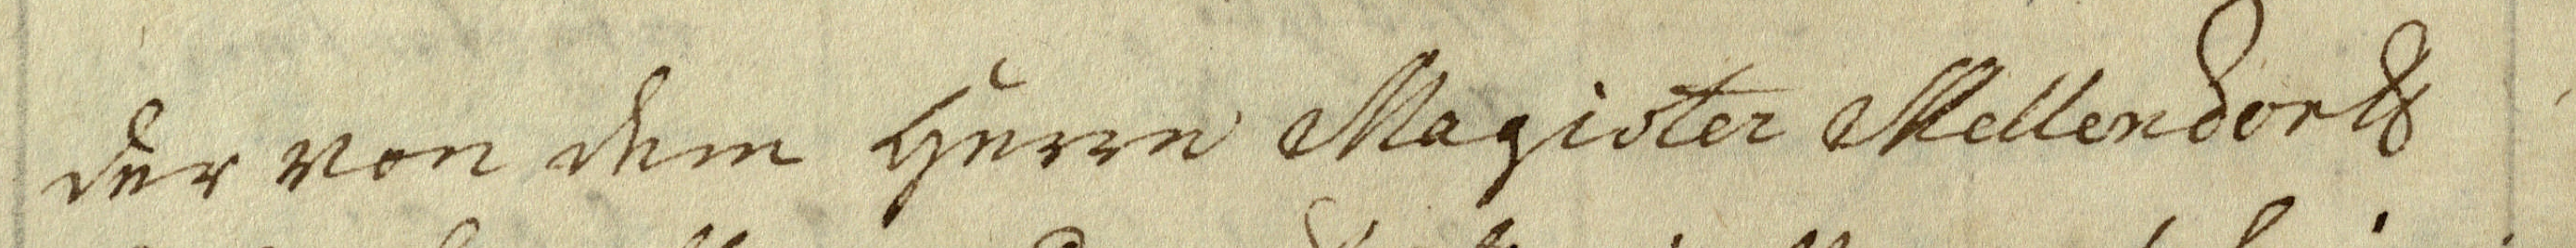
Der von dem Herrn Magister Mellendorff
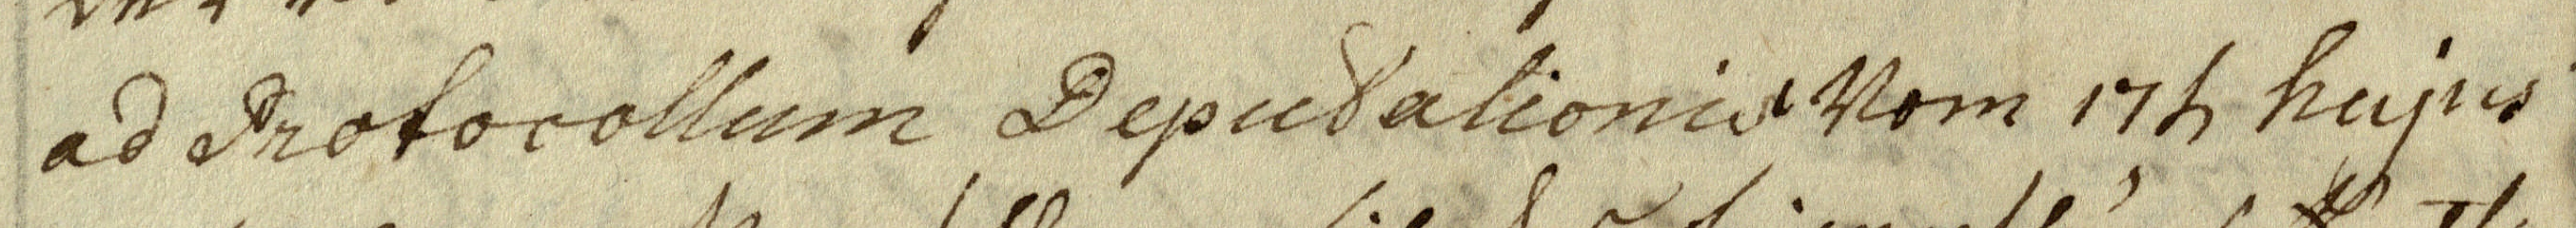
ad Protocollum Deputationis vom 17 t hujus
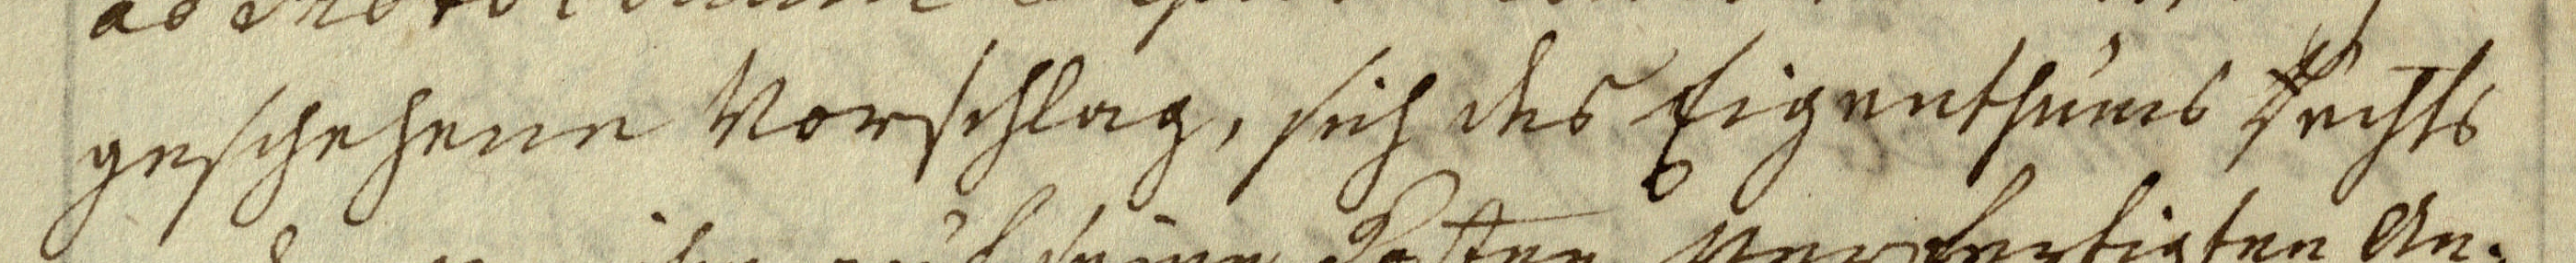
geschehene Vorschlag, sich des Eigenthums Rechts
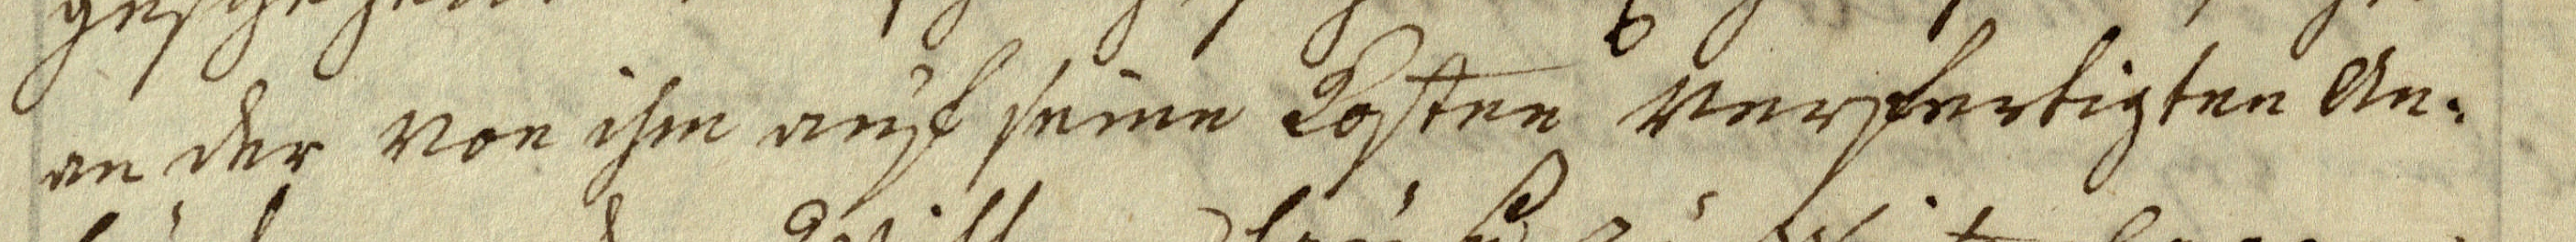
an der von ihm auf seine Kosten verfertigten An¬
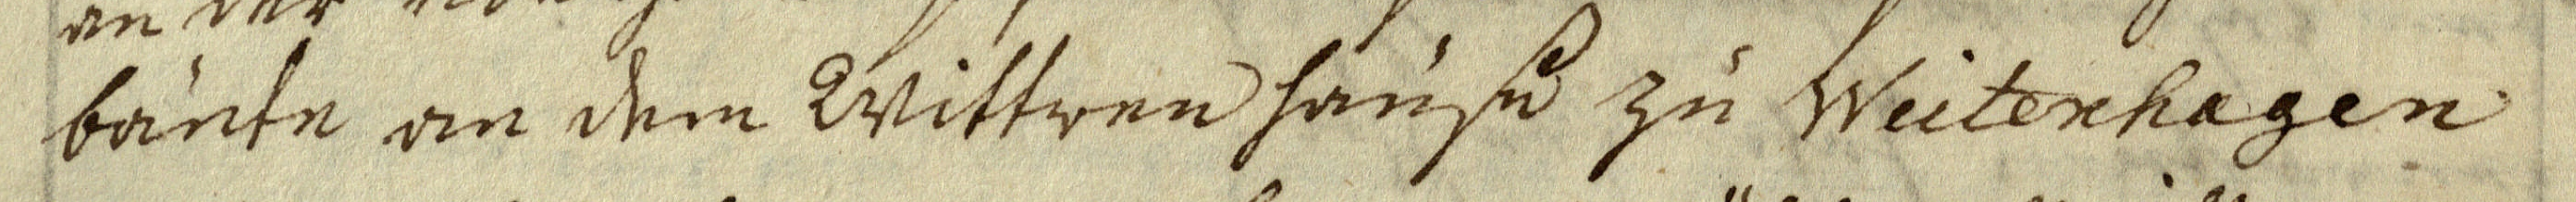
baute an dem Wittwenhause zu Weitenhagen
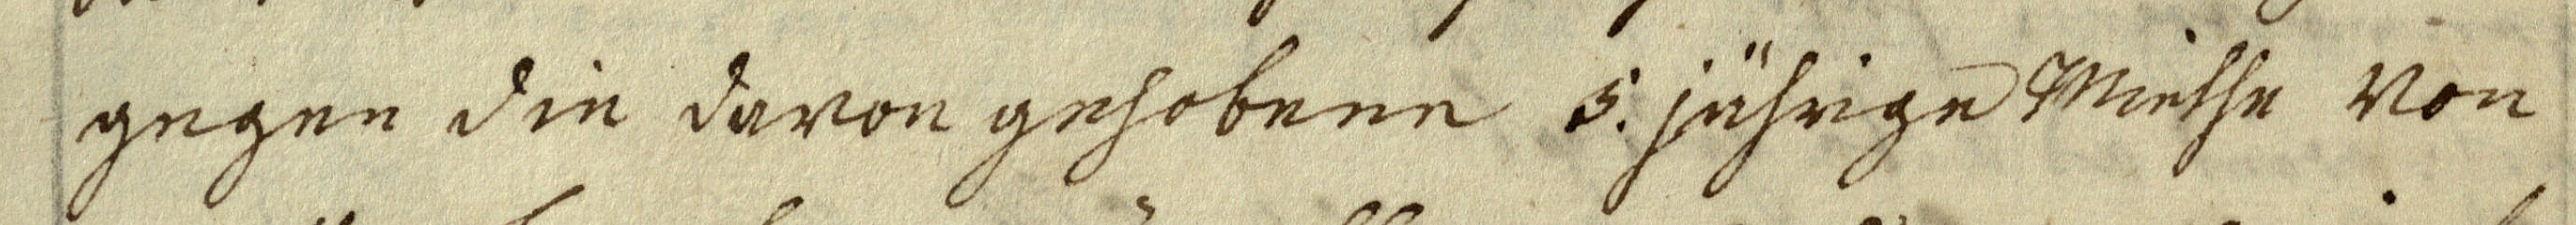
gegen die davon gehobene 5 jährige Miethe von
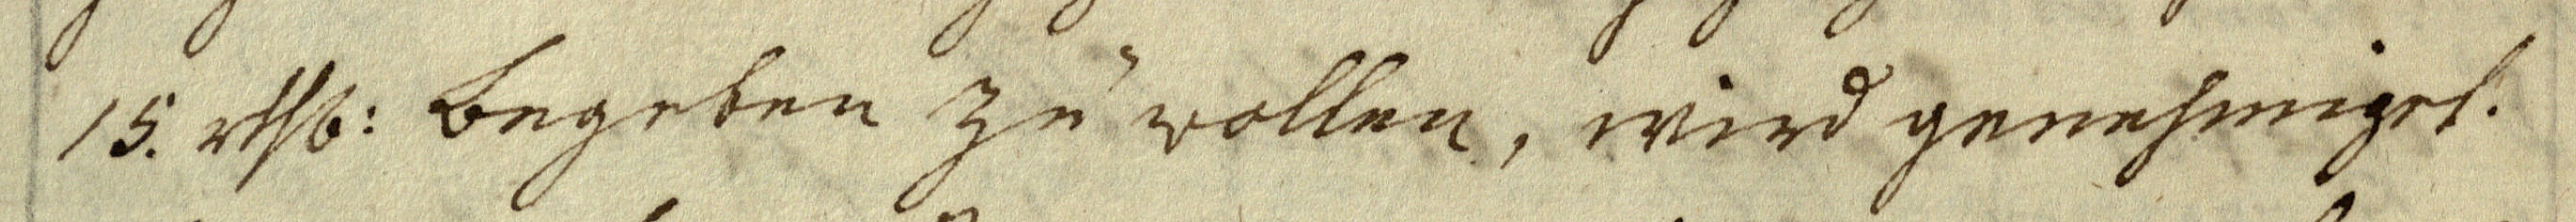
15. rth. begeben zu wollen, wird genehmiget.
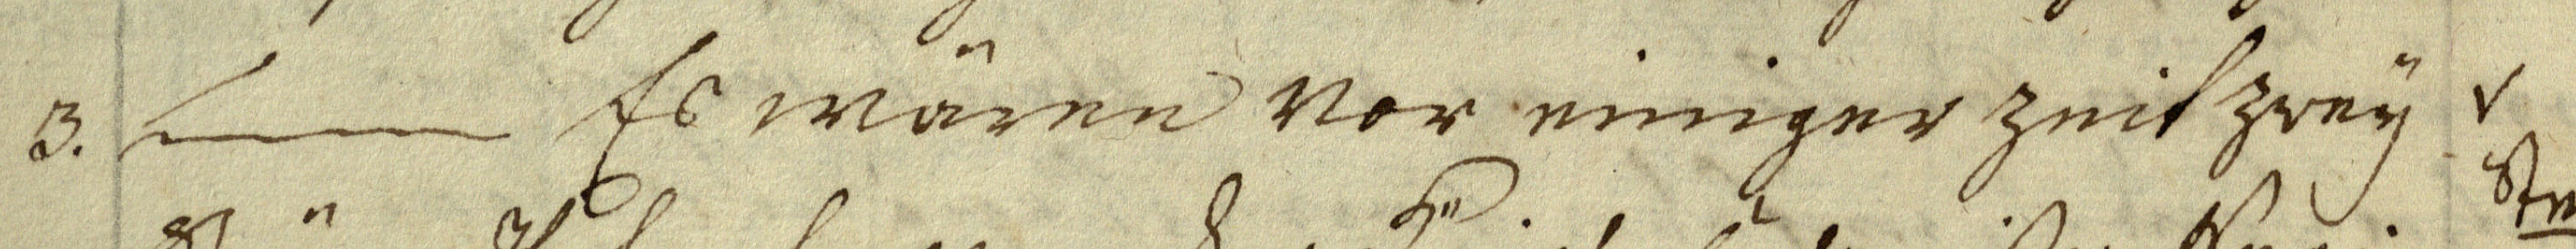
3. Es wären vor einiger Zeit zweÿ
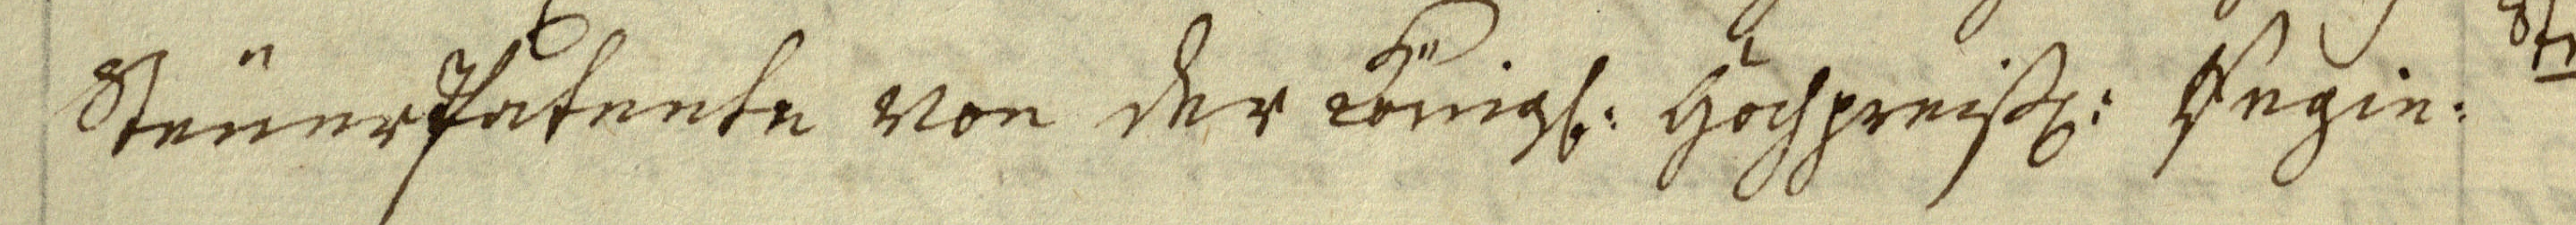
SteuerPatente von der Königl. Hochpreißl. Regie¬
